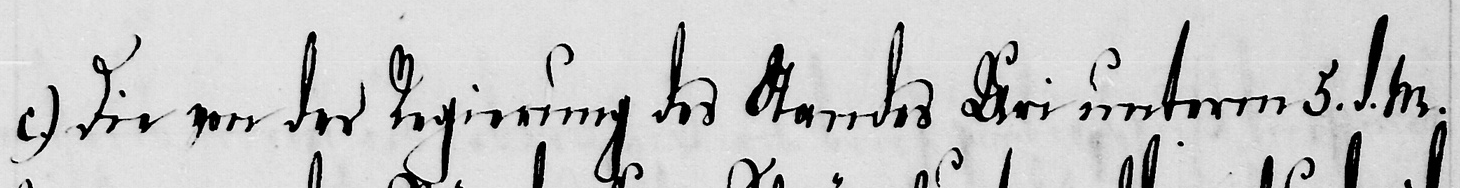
c.) Die von der Regierung des Standes Uri unterm 5. d. M.
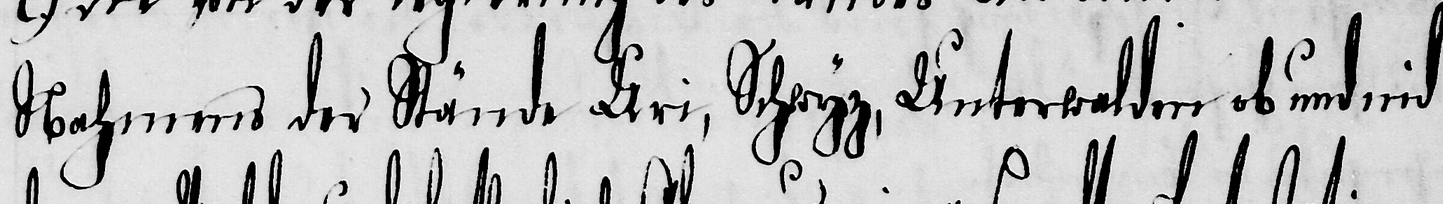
Nahmens der Stände Uri, Schwyz, Unterwalden ob und nid
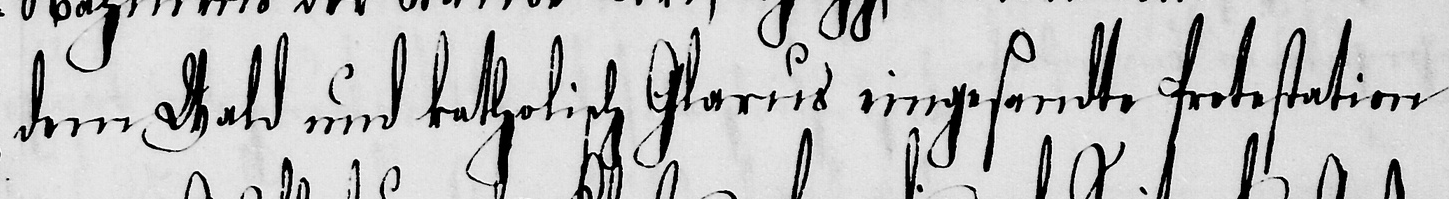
dem Wald und katholisch Glarus eingesandte Protestation
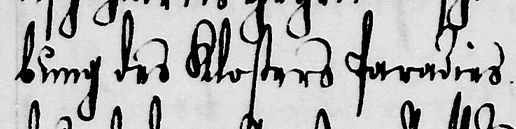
ebung des Klosters Paradies
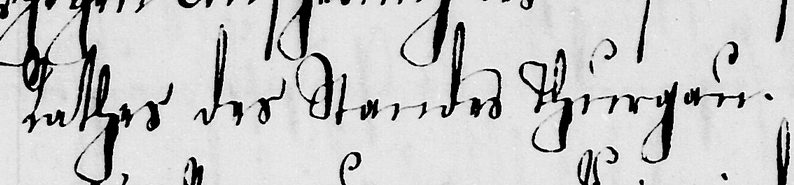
Rathes des Standes Thurgau.
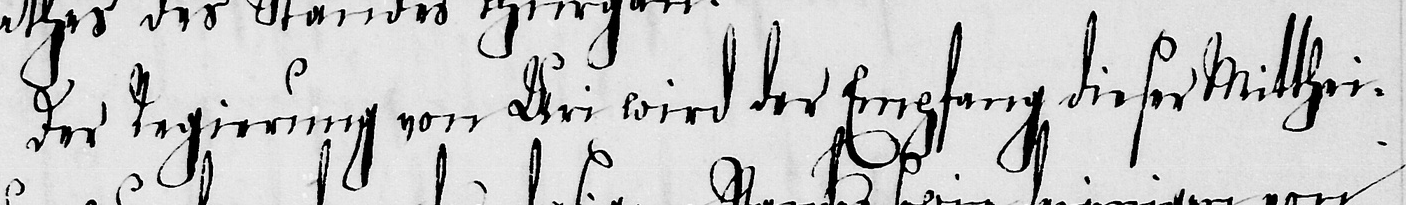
Der Regierung von Uri wird der Empfang dieser Mitthei¬
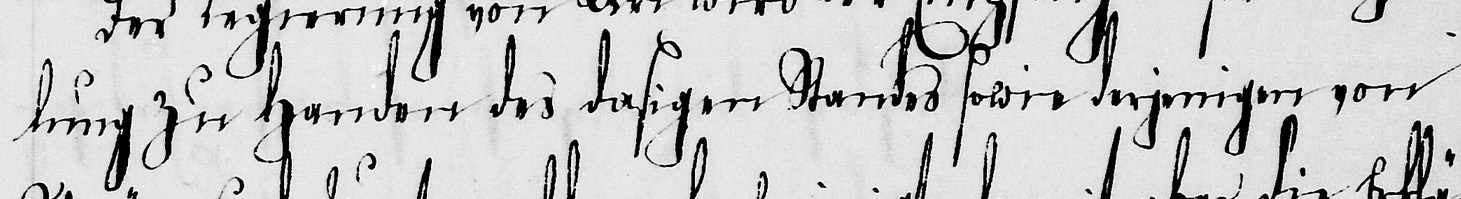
lung zu Handen des dasigen Standes sowie derjenigen von
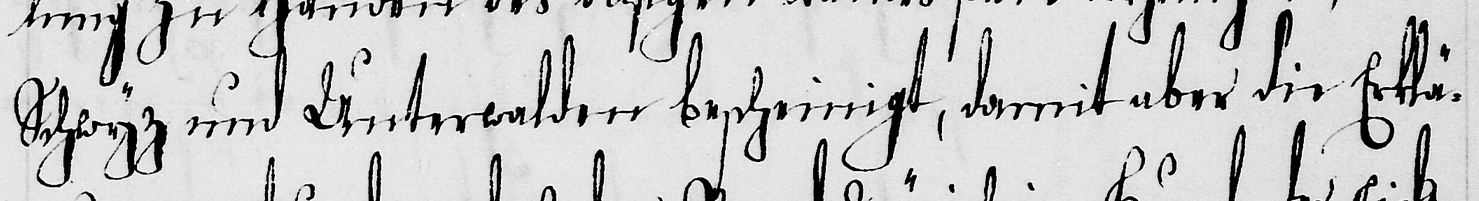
Schwyz und Unterwalden bescheinigt, damit aber die Erklä¬
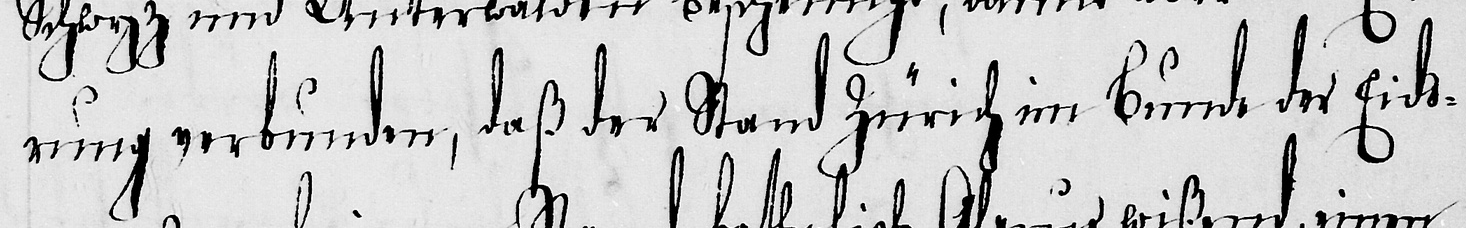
rung verbunden, daß der Stand Zürich im Bunde der Eids¬
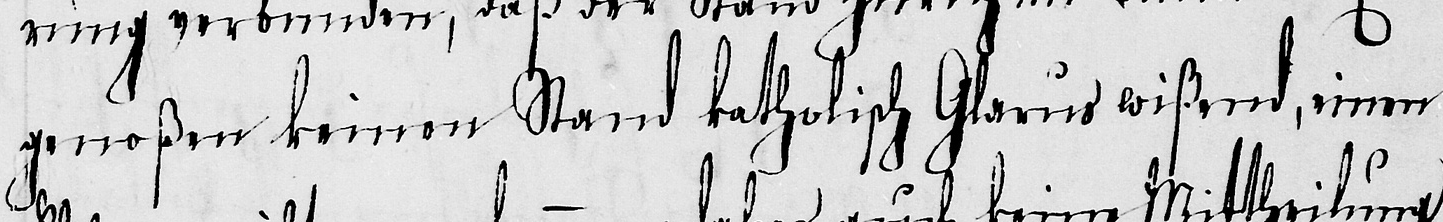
genoßen keinen Stand katholisch Glarus wißend, einen
